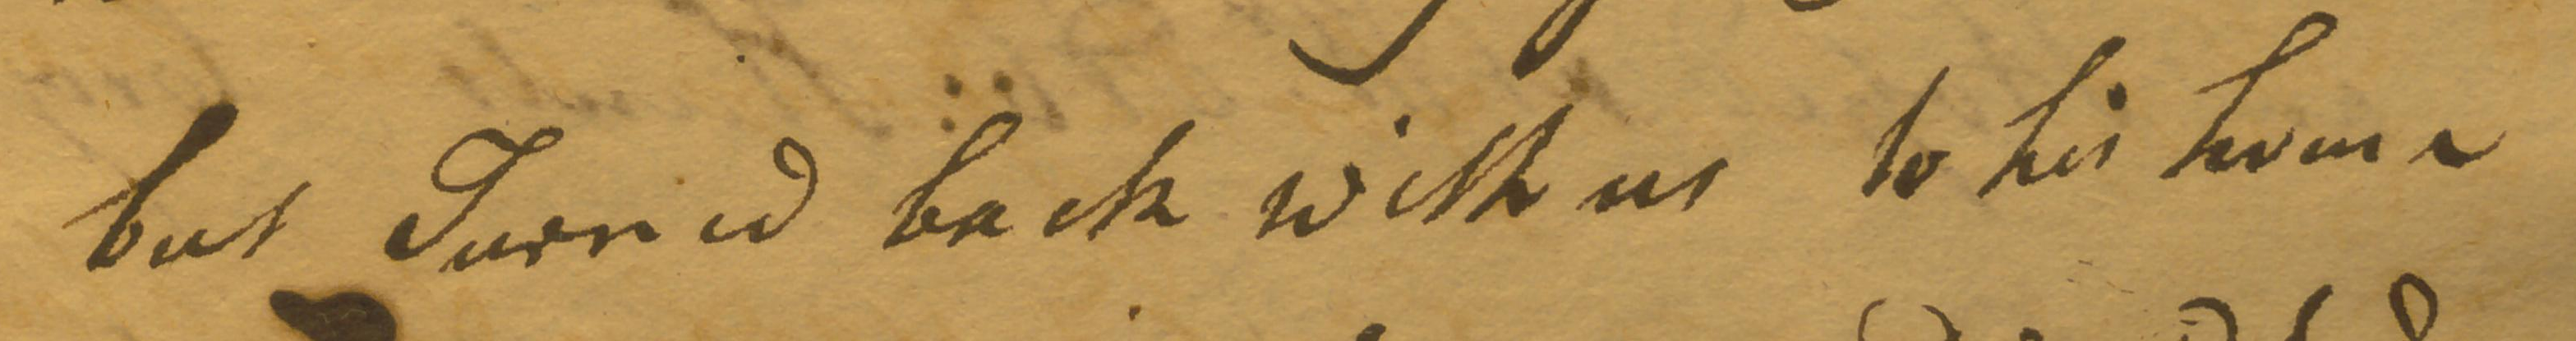but Turned back with us to his home
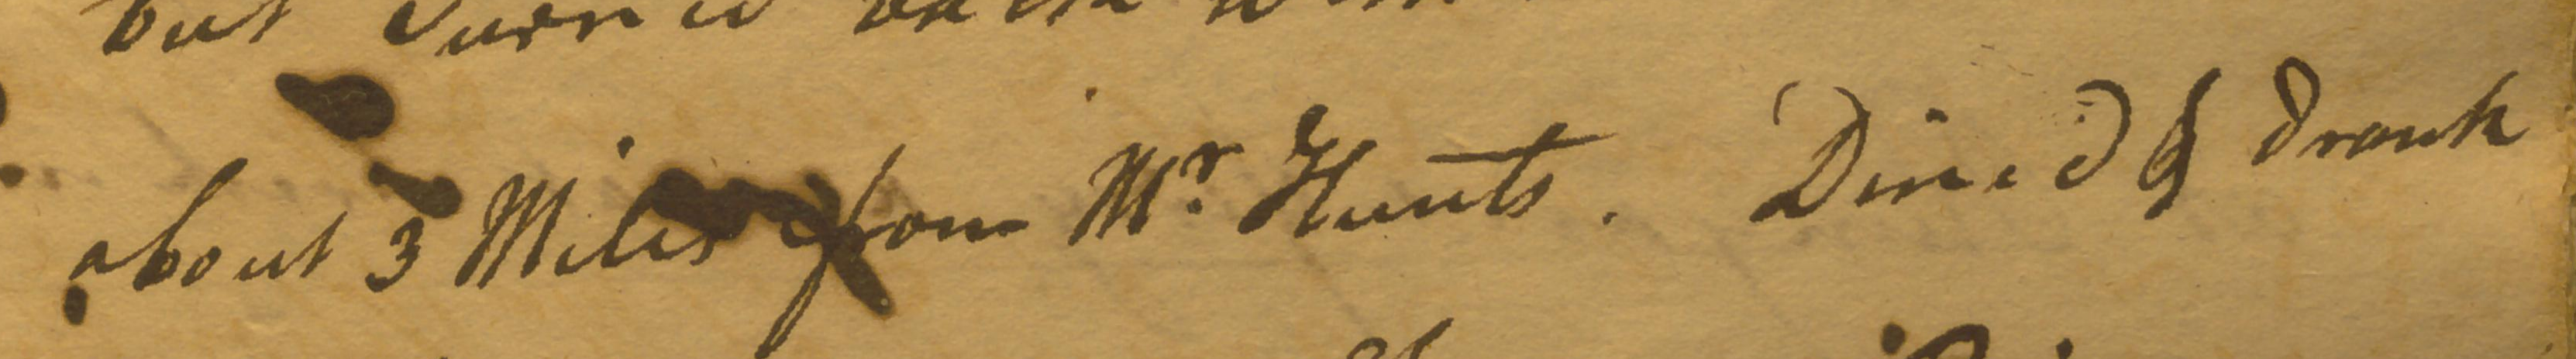about 3 Miles fom M^r. Hunts. Dined & drank
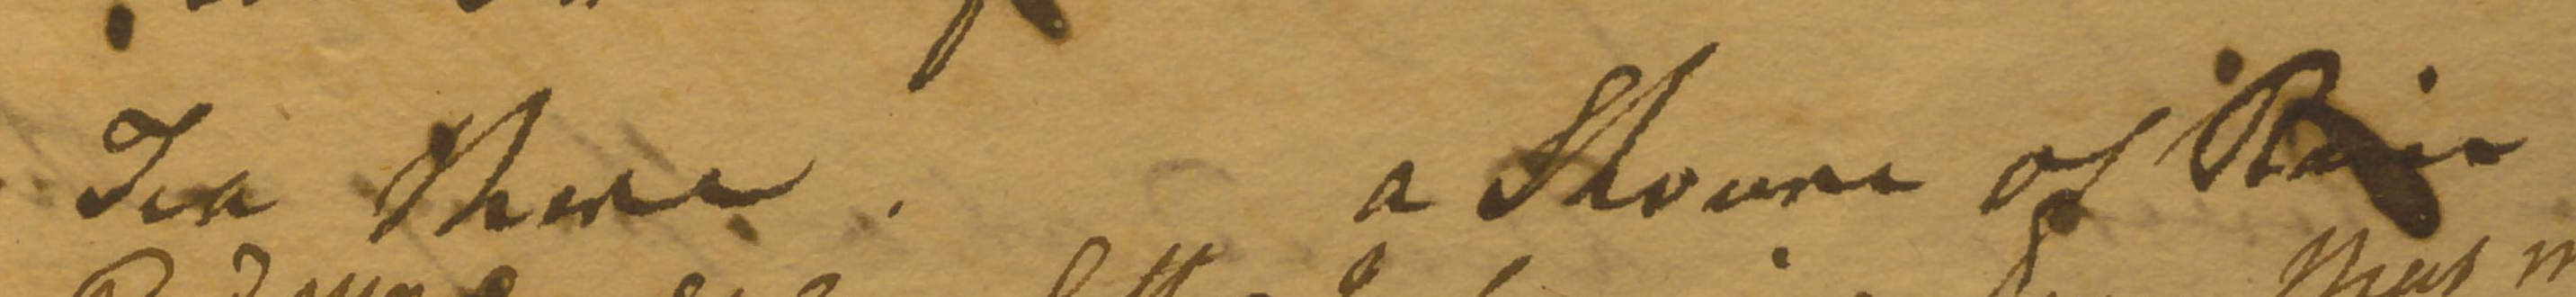Tea there. a Shoure of Ran
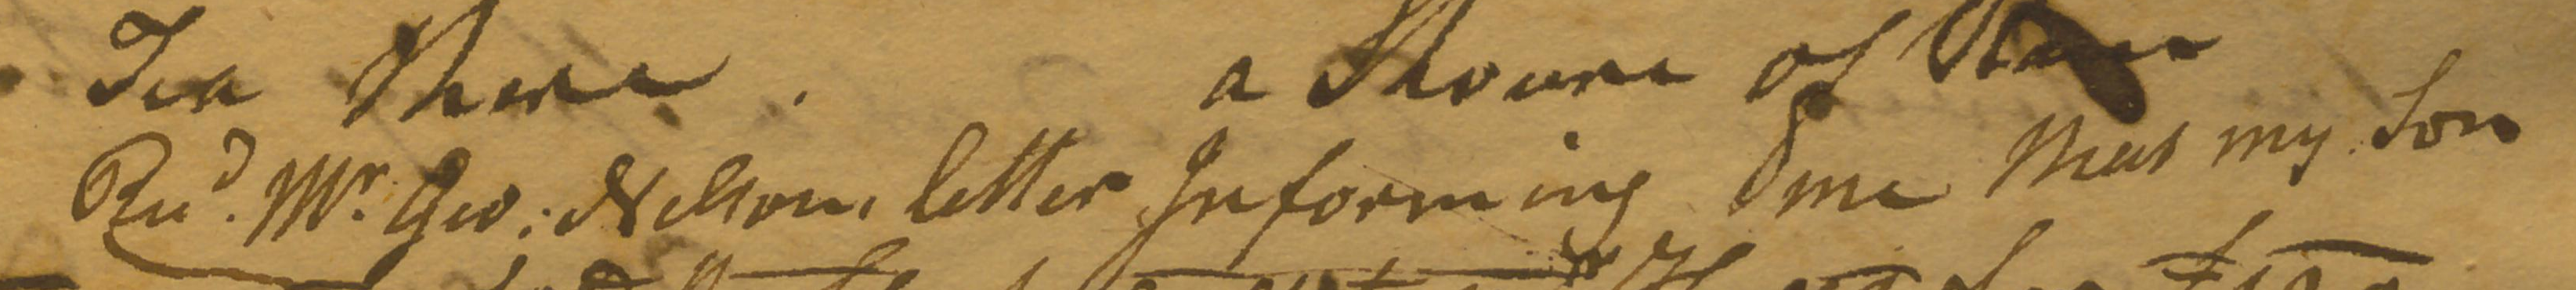Rec^d. M^r. Geo: Nelsons letter Informing me that my son
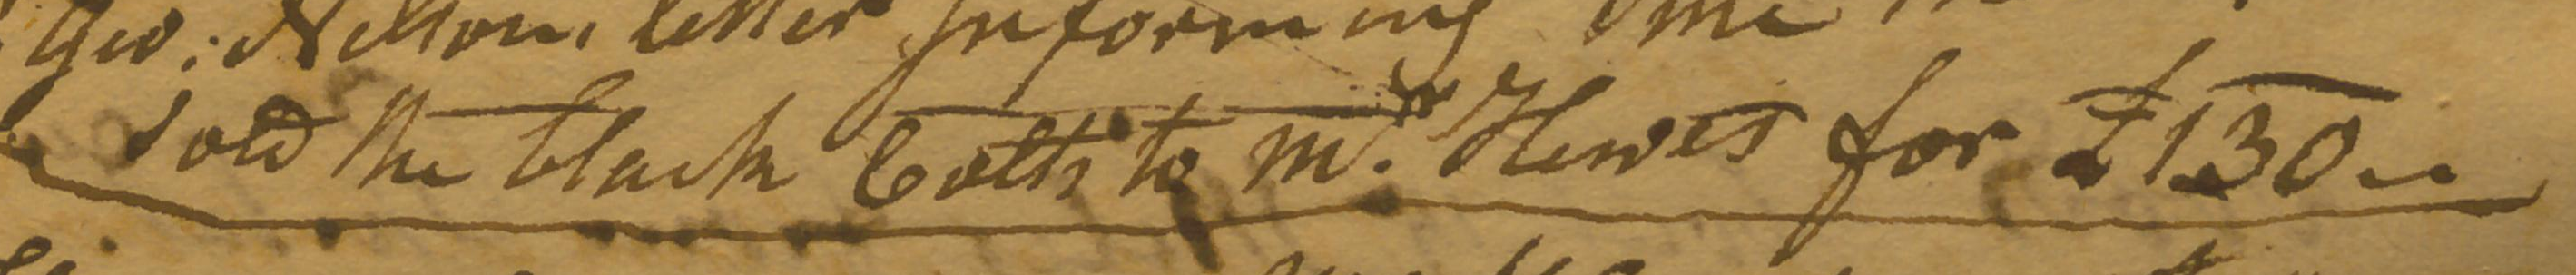sold the black Colts to M^r. Hewes for £130-
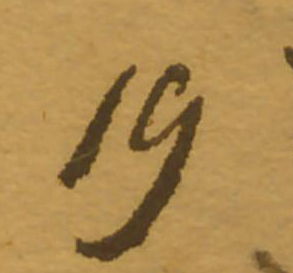19
